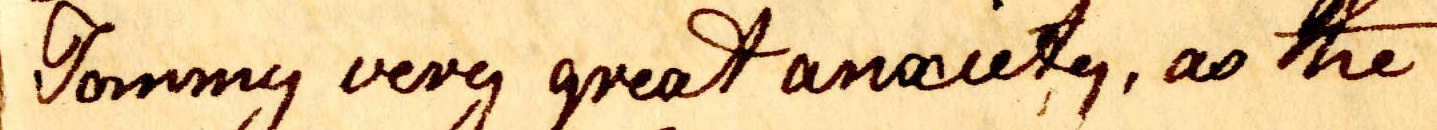Tommy very great anxiety, as the
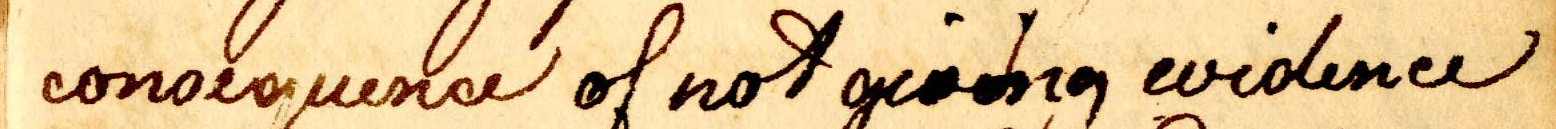consequence of not giving evidence
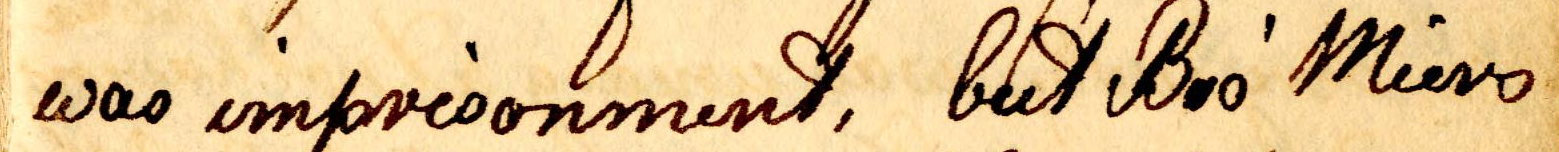was imprisonment, but Bro' Miers
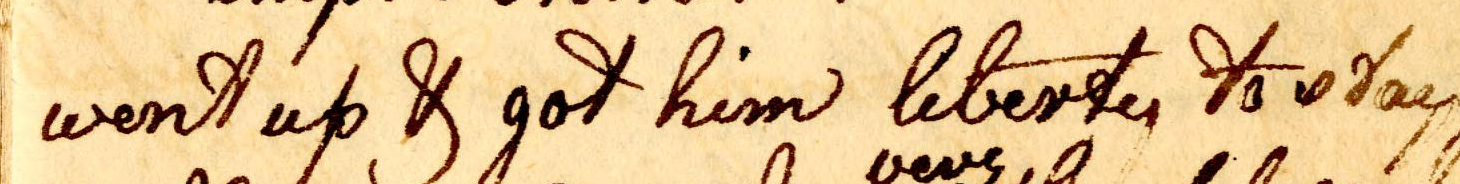went up & got him liberty to stay
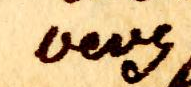very
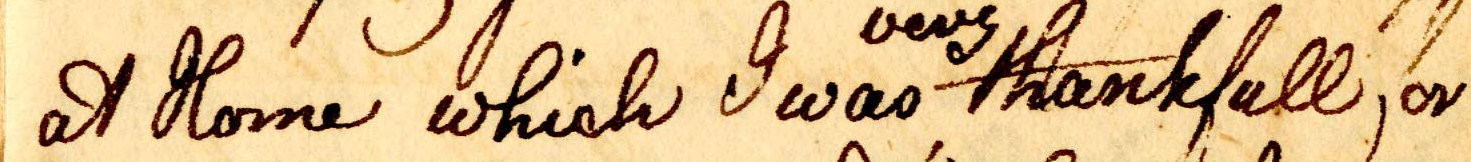at Home which I was ^ thankfull for
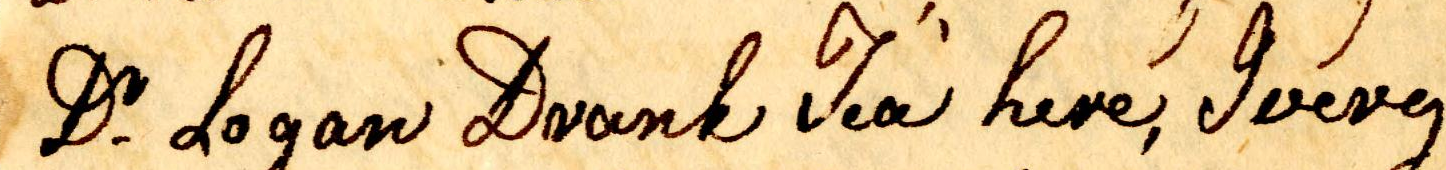D^r. Logan Drank Tea here, I very
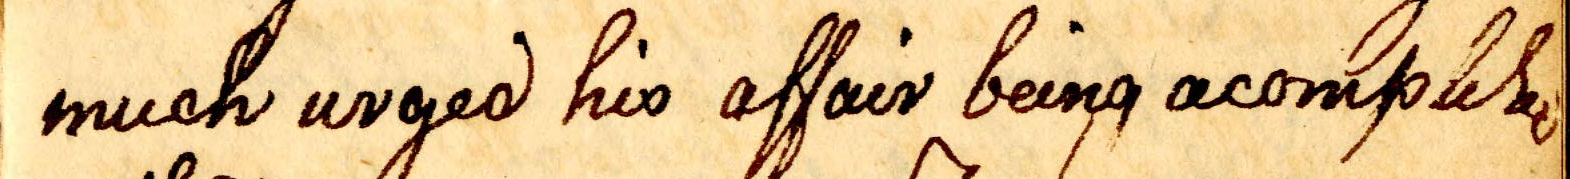much urged his affair being acomplised
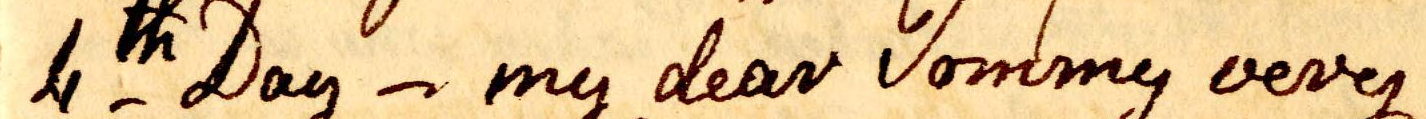4^th Day- my dear Tommy very
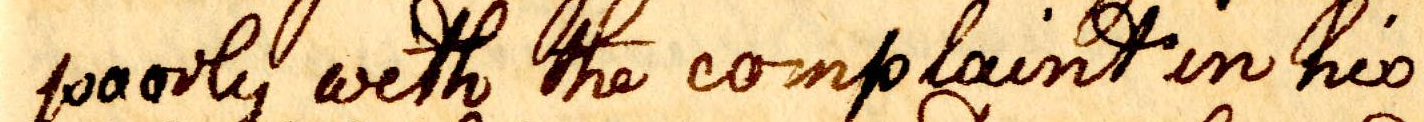poorly with the complaint in his
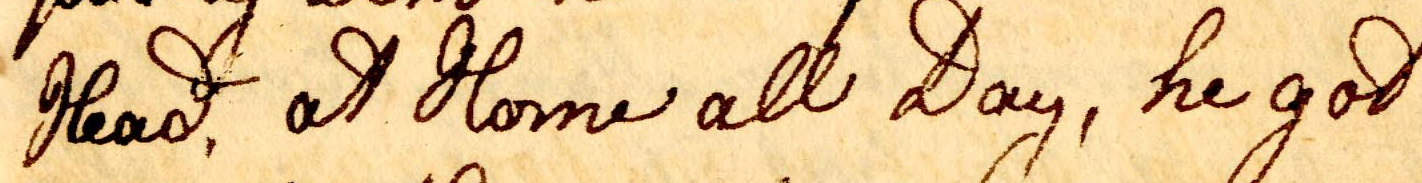Head, at Home all Day, he got
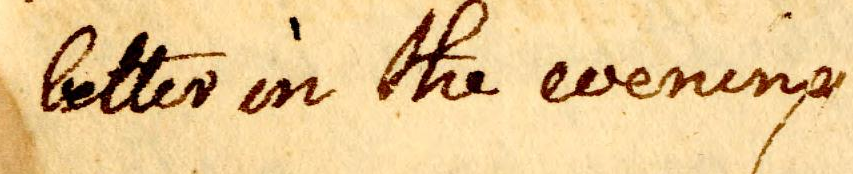better in the evening
